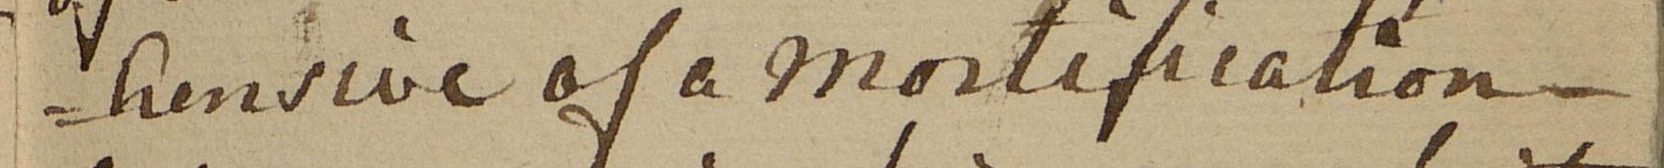-hensive of a mortification-
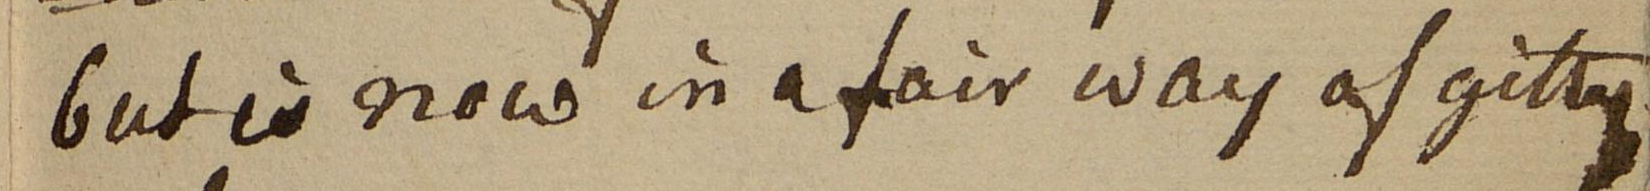but is now in a fair way of gitty
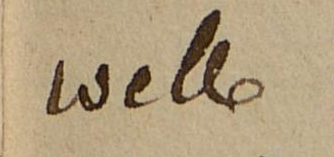well -
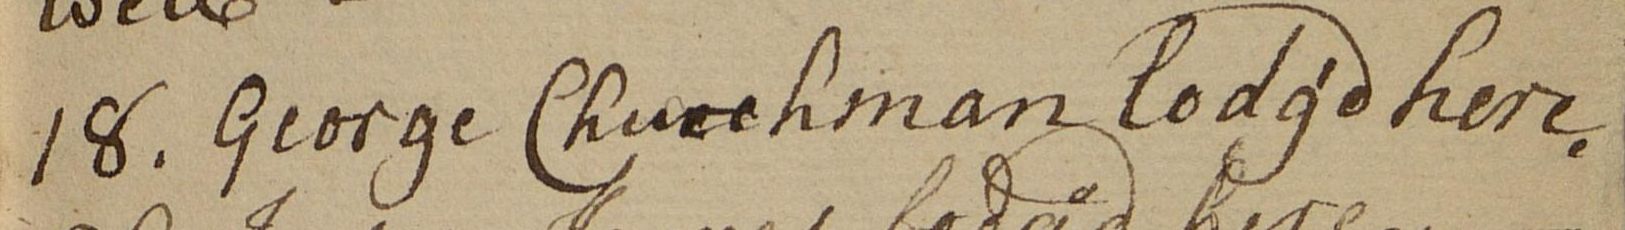18. George Churchman lodg'd here.
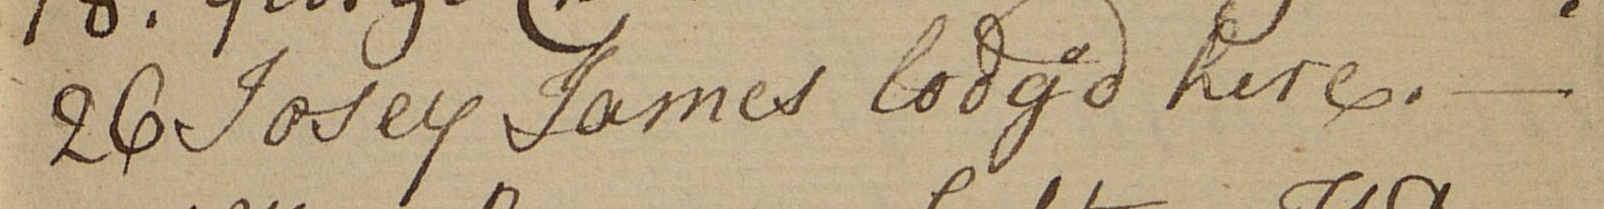26 Josey James lodg'd hirgs-
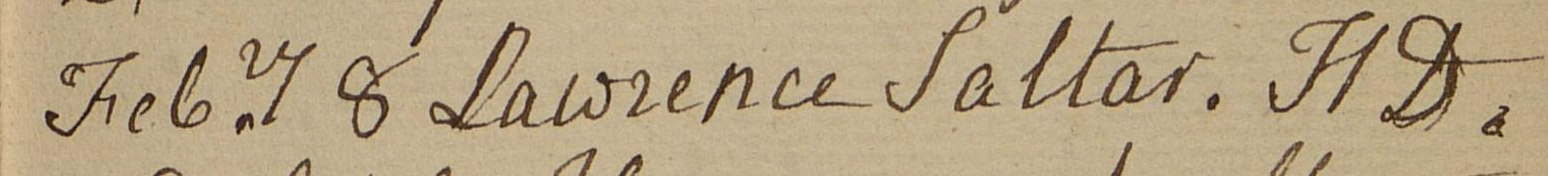Feb^ry 8 Lawrence Saltar. HD.
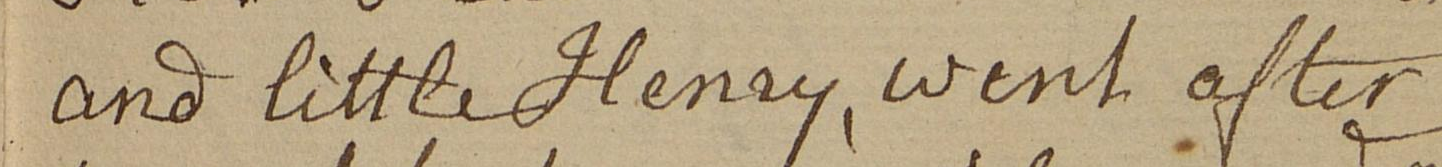and little Henry, went after
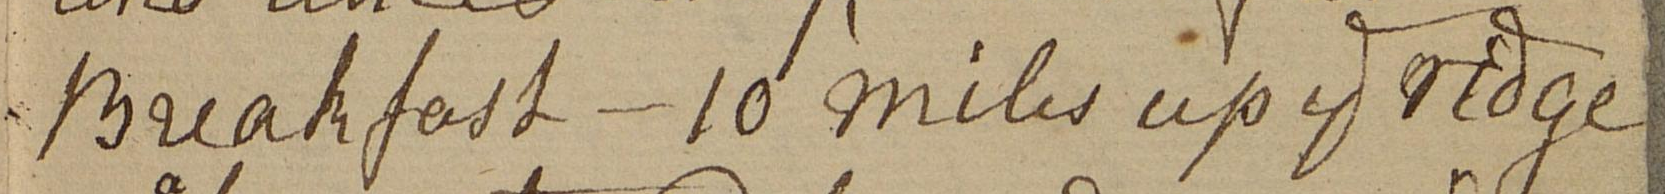Breakfast- 10 miles up y^e ridge,
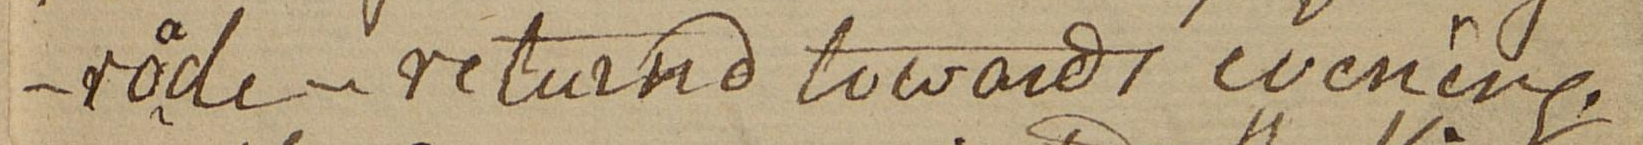-ro ^a de- returnd towards evening,
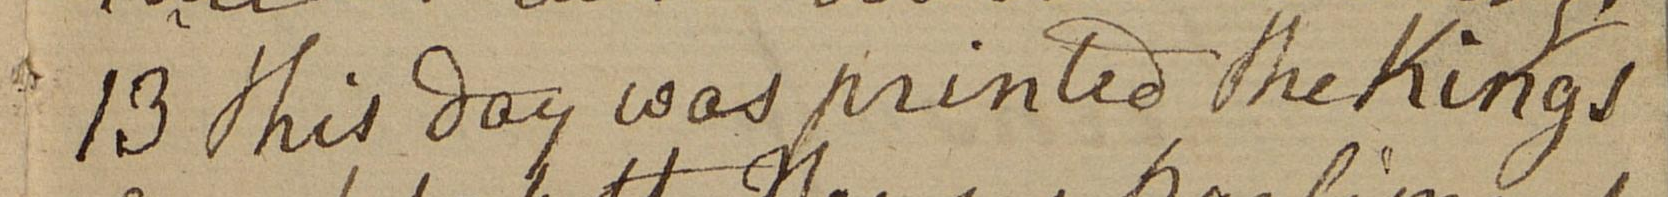13 this day was printed the Kings
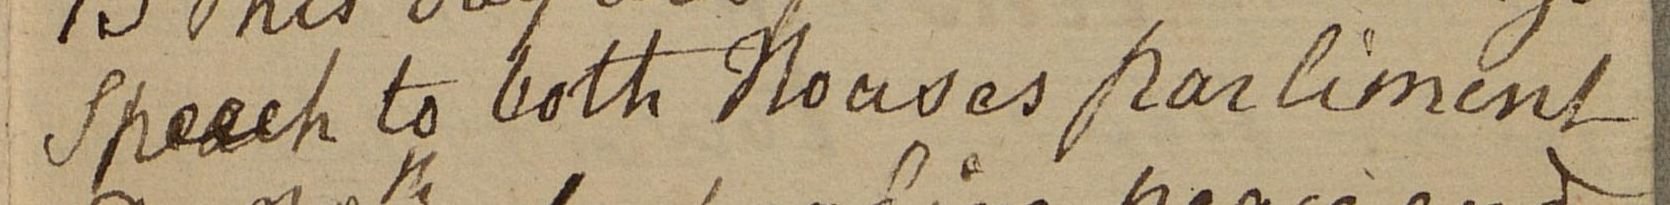speech to both Houses Parliment
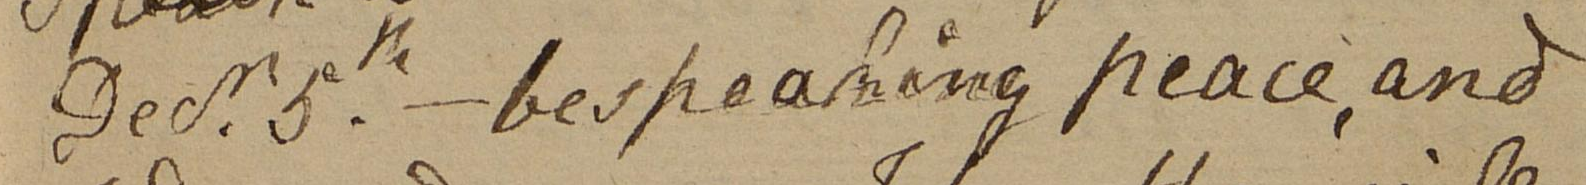Dec^r 5^th.- bespeaking peace, and
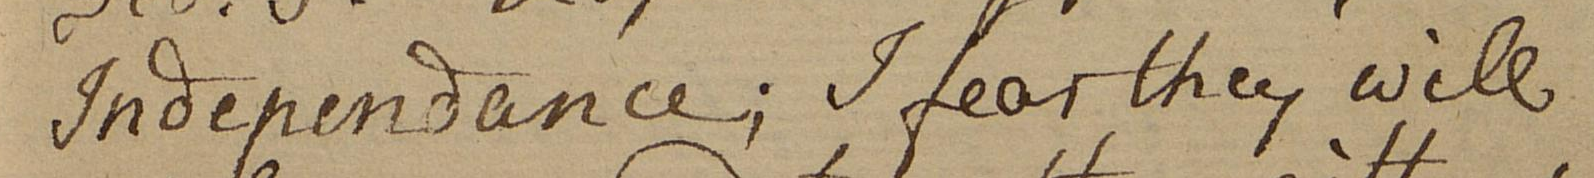Independance; I fear they will
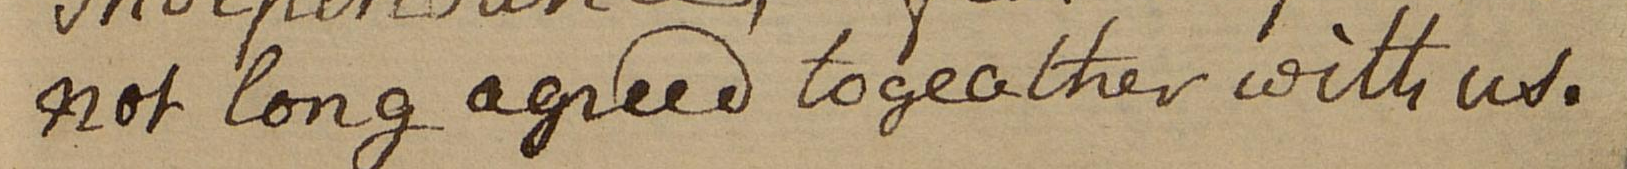not long agreed togeather with us-
